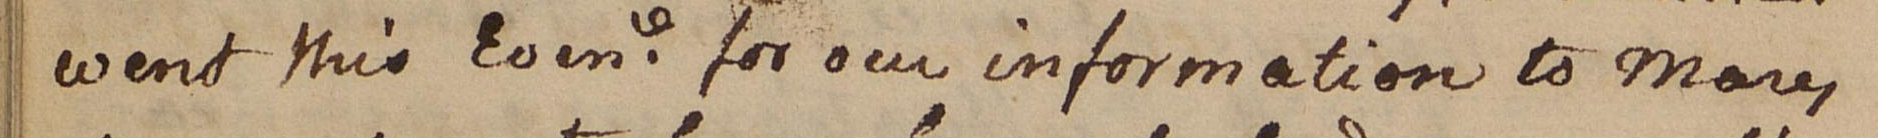went this Even^g. for our information to Mary
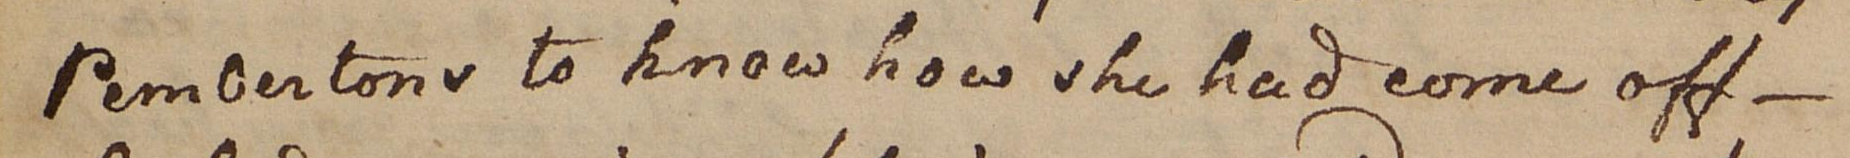Pembertons to know how she had come off-
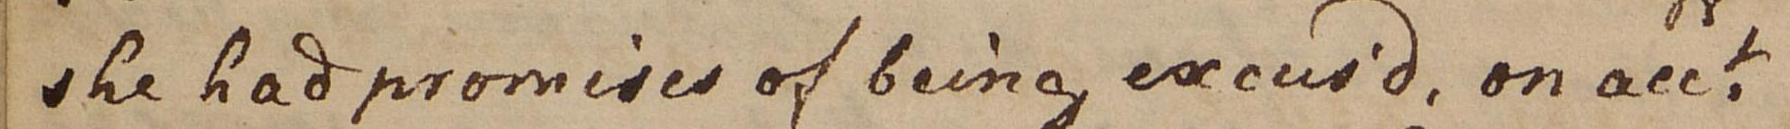she had promises of being excus'd, on acc^t.
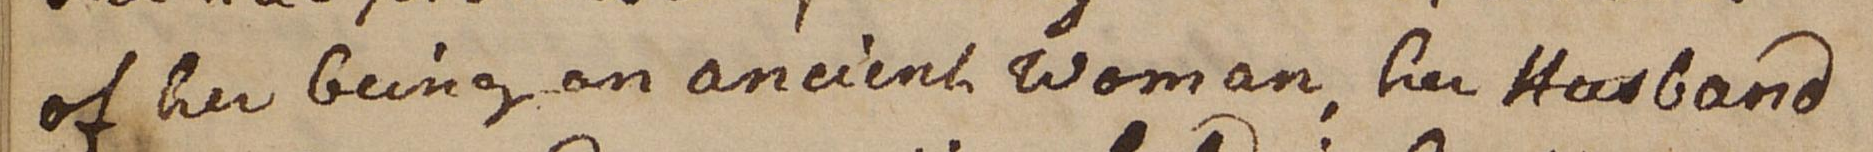of her being on ancient Woman, her Husband
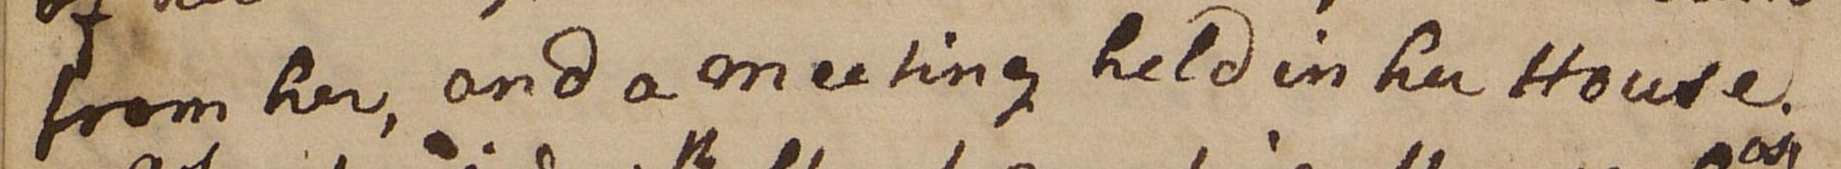from her, and a meeting held in her House.
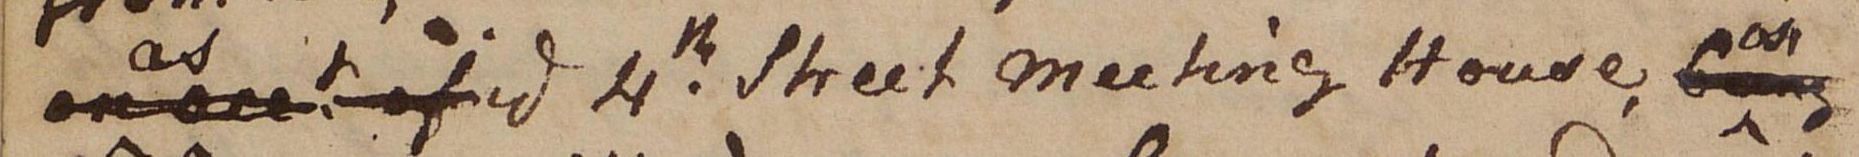[on acc^t. of] y^e 4^th. Street Meeting House, [____] ^all
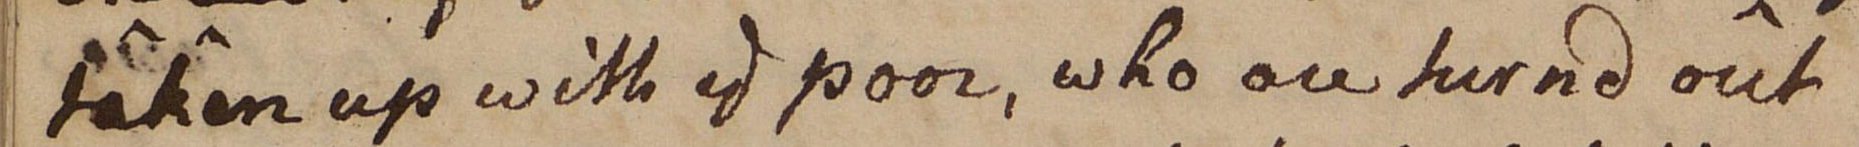taken up with y^e poor, who are turnd out
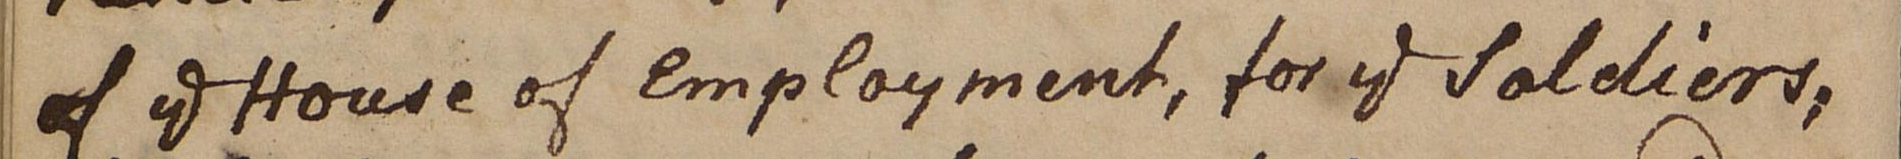of y^e House of Employment, for y^e Soldiers;
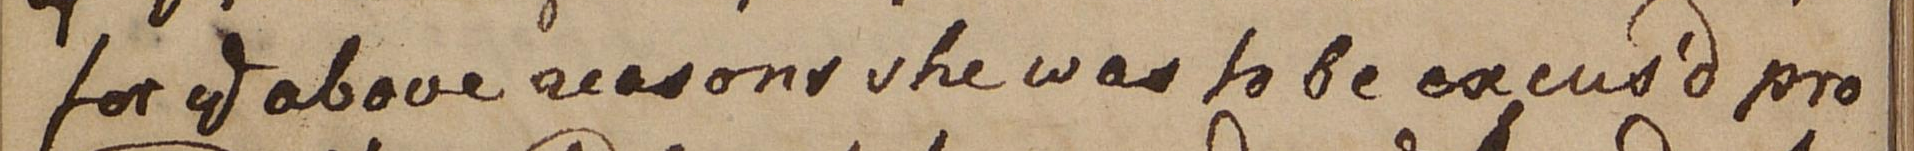for y^e above reasons she was to be excus'd pro
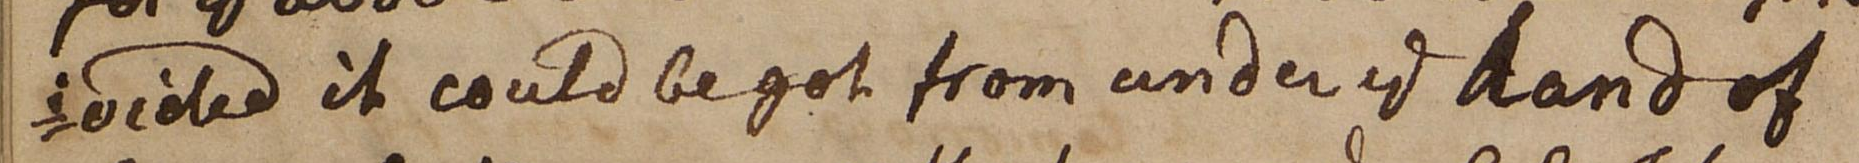-vided it could be got from under y^e hand of
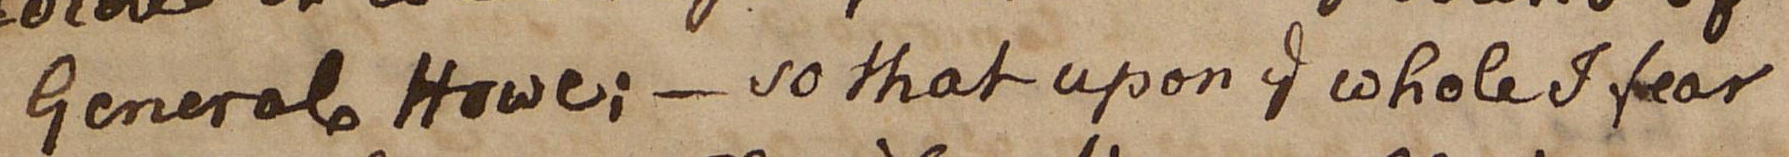General Howe;- so that upon y^e whole I fear
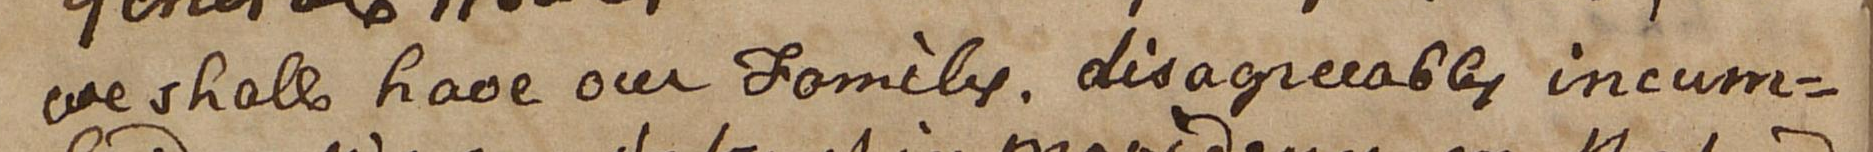we shall have our Family. disagreeably incum-
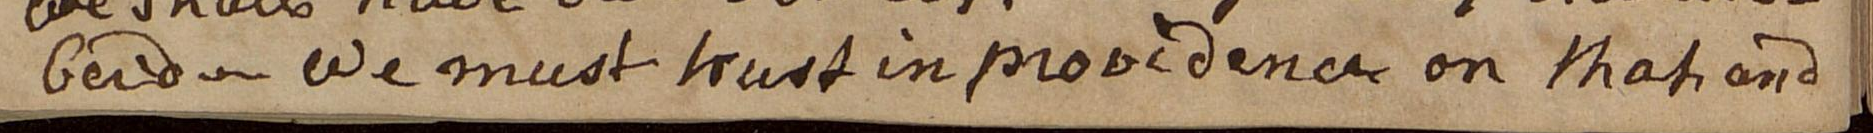berd- We must trust in providence on that and
